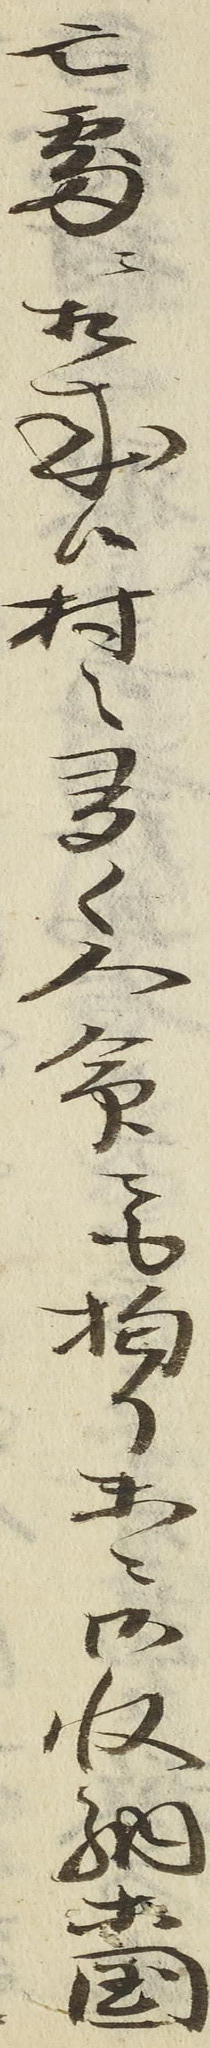亡処二相成候村々多く人命二も拘り末々御収納御
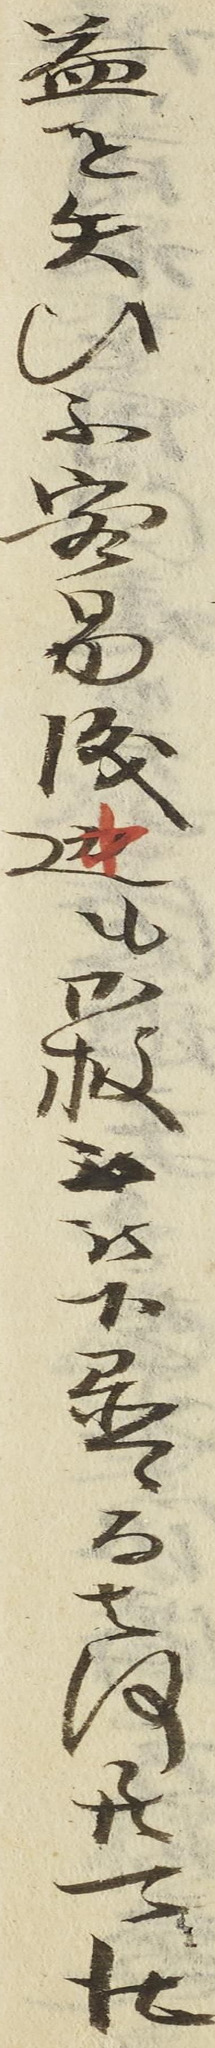益を失ひ不容易儀迚も御救不被下置候而は何共可仕
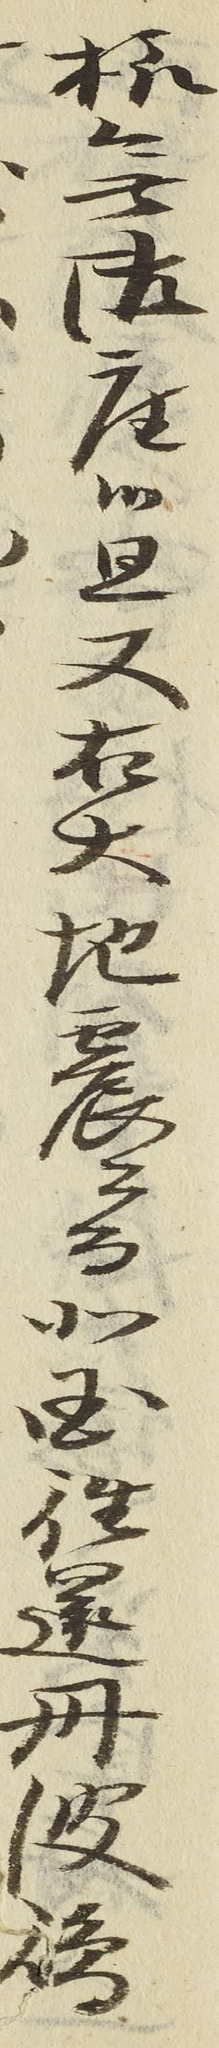様無御座候且又大地震二而北国往還丹波嶋
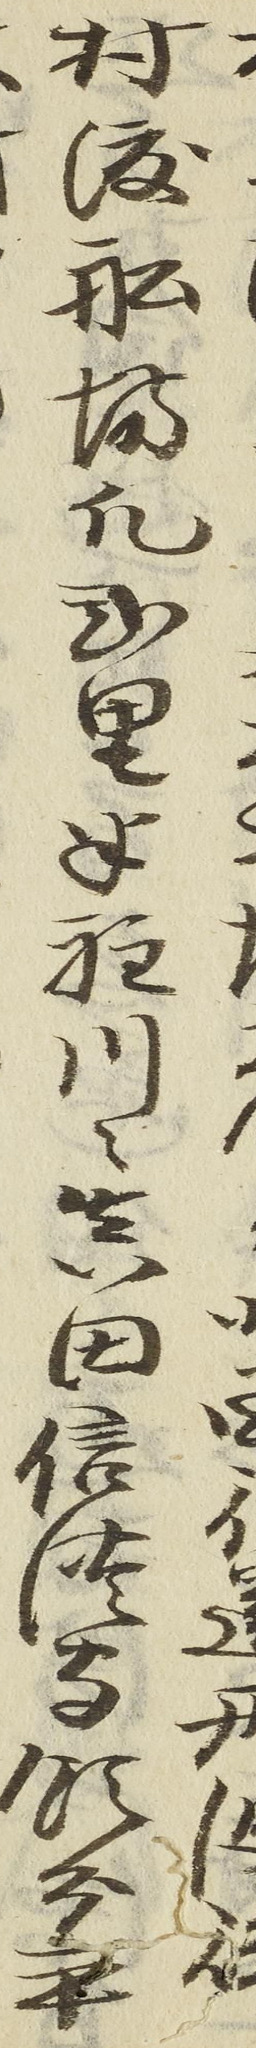村渡船場凡二里半程川之真田信濃守領分平
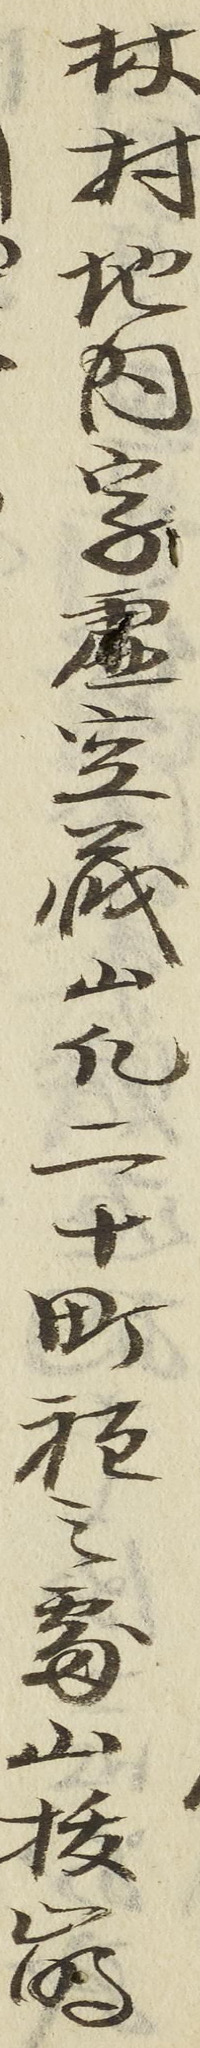林村地内字虚空蔵山凡二十町程之処山抜崩
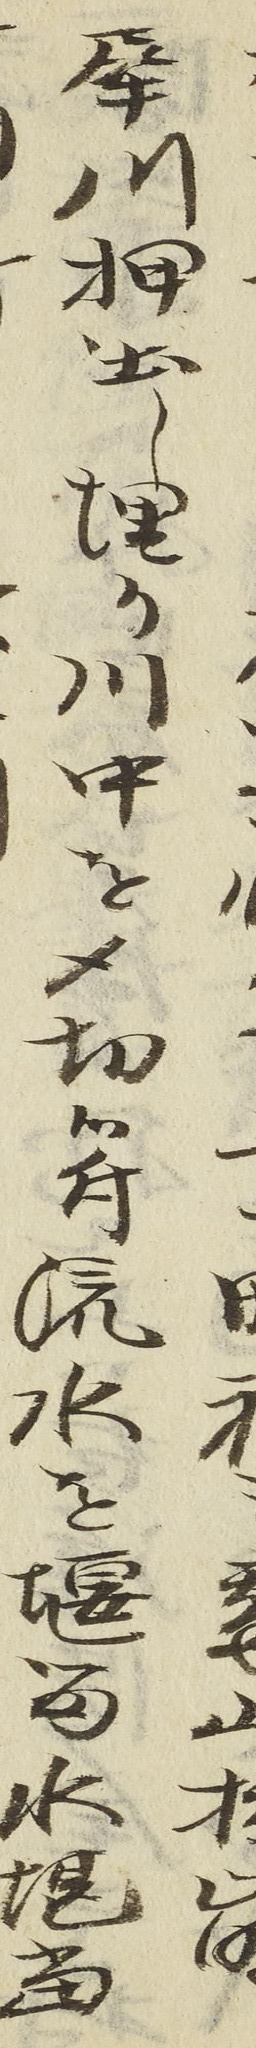犀川押出し埋り川中を〆切候付流水を堰留水湛当
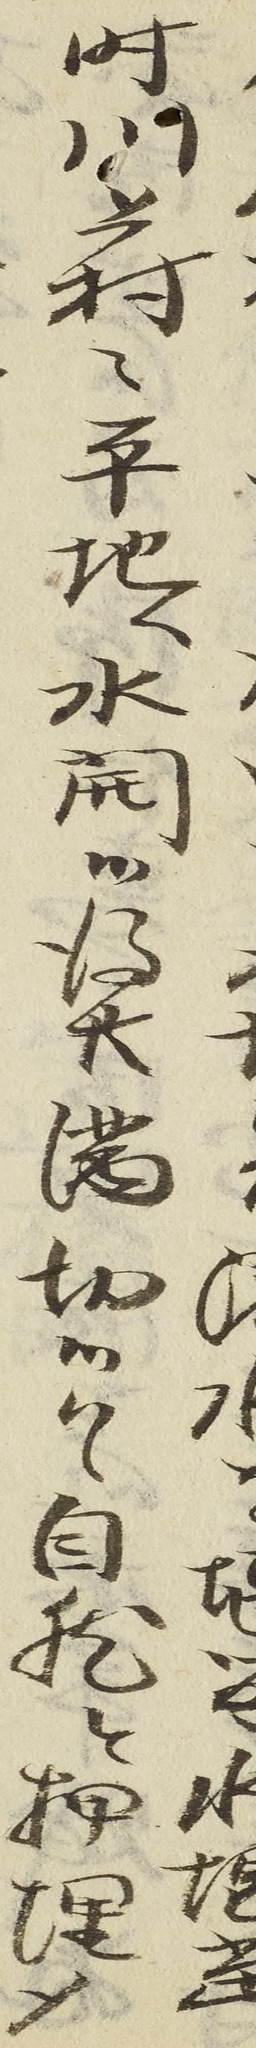時川上村々平地へ水開候得共湛湛切候ハゝ自然と押埋〆
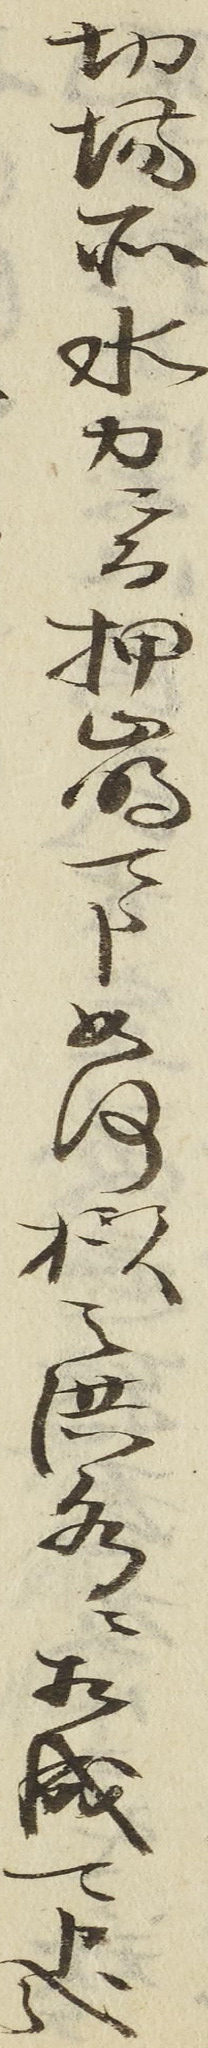切場所水力二而押崩可申如何様之洪水二相成可申哉
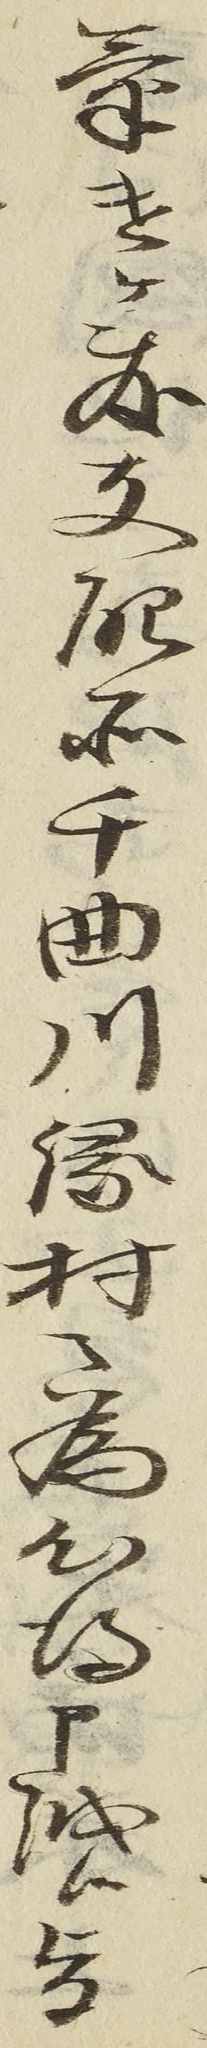気遣ヶ敷支配所千曲川縁村々為心得之申越候旨
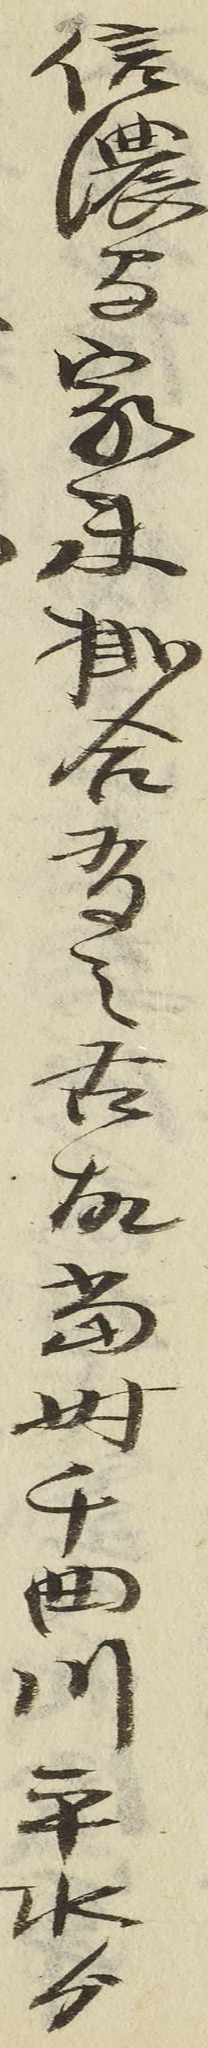信濃守家来掛合有之右故当時千曲川平水ゟ
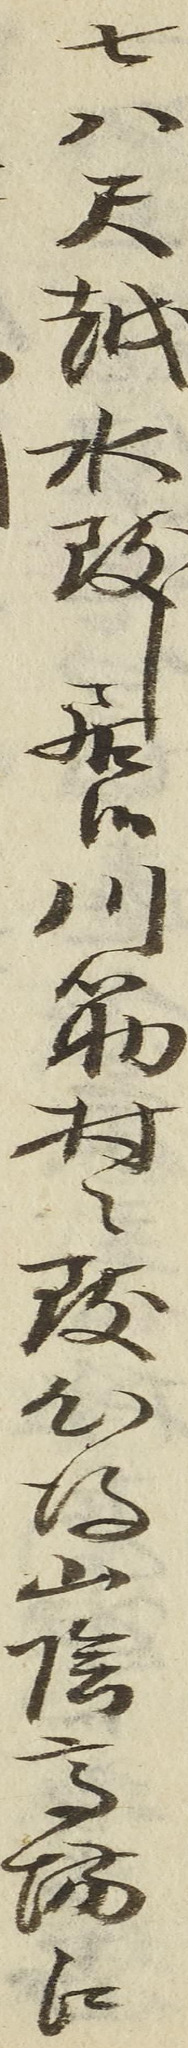七八尺減水致ㇱ居候川筋村々致心得山陰高場江
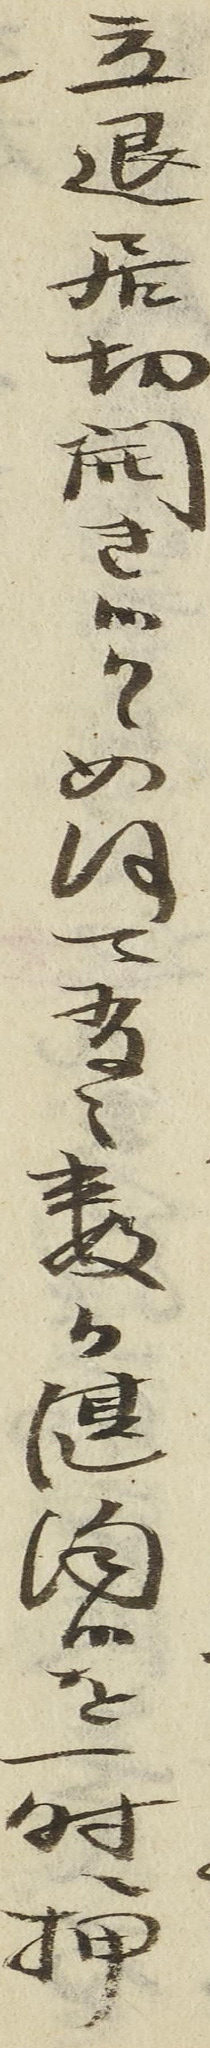立退居切開候ハゝ如何可有之数日湛溜候を一時二押
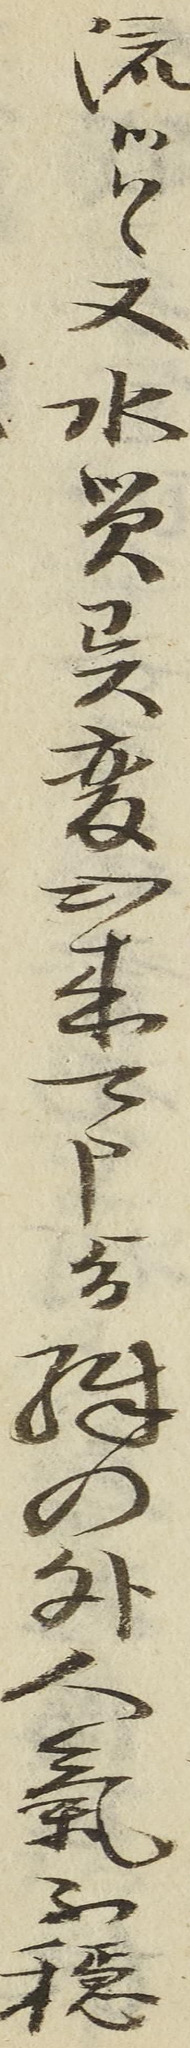流候ハゝ又水災異変出来可申と殊の外人気不穏
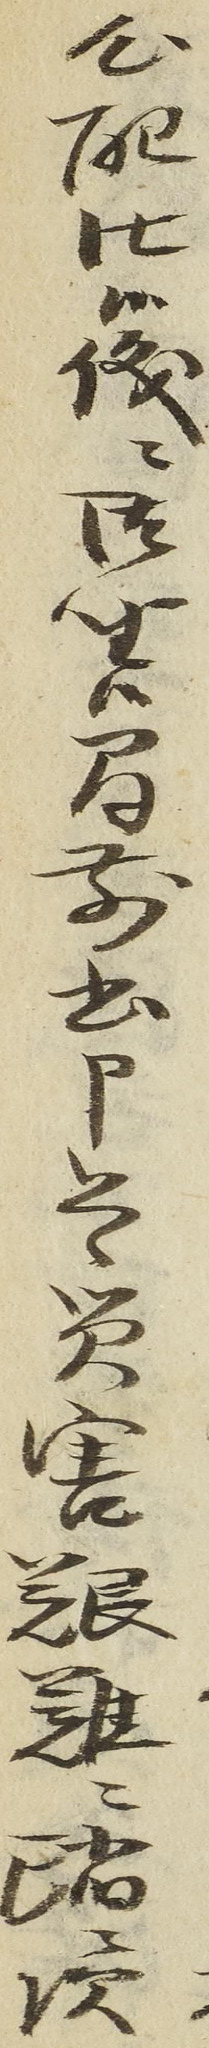心配仕候儀二御座候間前書申上候災害艱難二陥候次

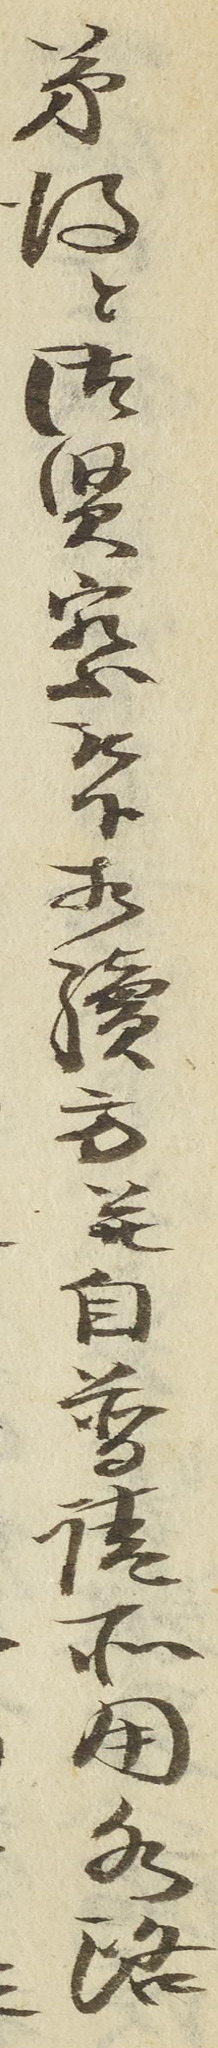第得と御賢察被下相続方并自普請所用水路
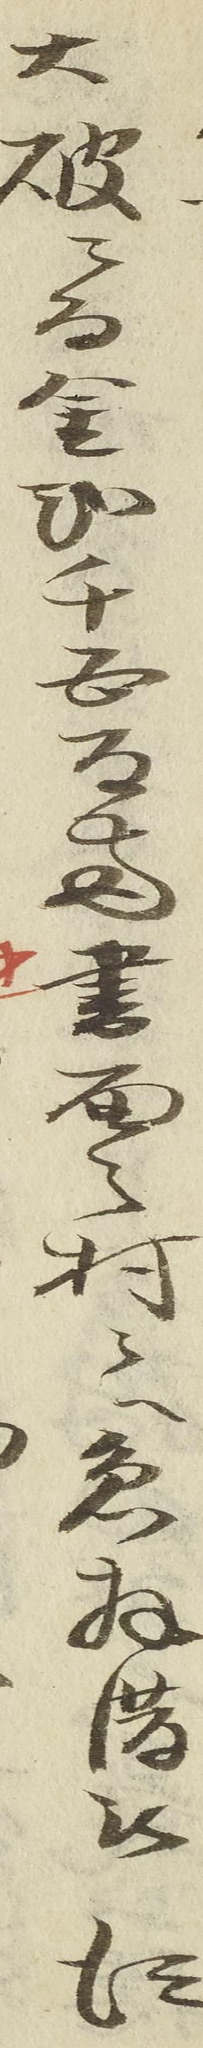大破二而金弐千五百両書面之村々へ急拝借被仰
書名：信濃國大地震記　乾
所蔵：東京大学地震研究所図書室 Earthquake Research Institute Library, The University of Tokyo, JAPAN
